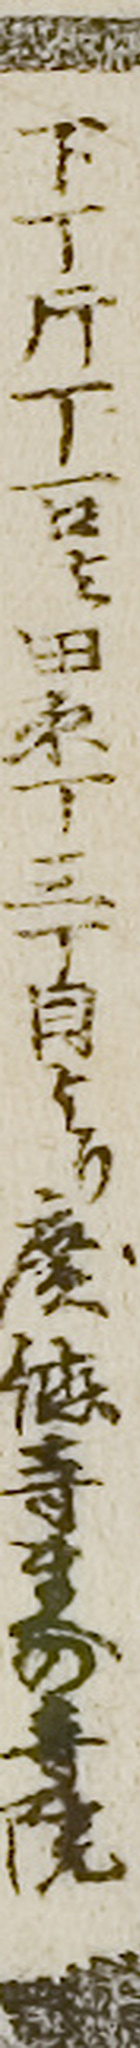下丁片丁一口と田原丁三丁目より広徳寺まへの寺院
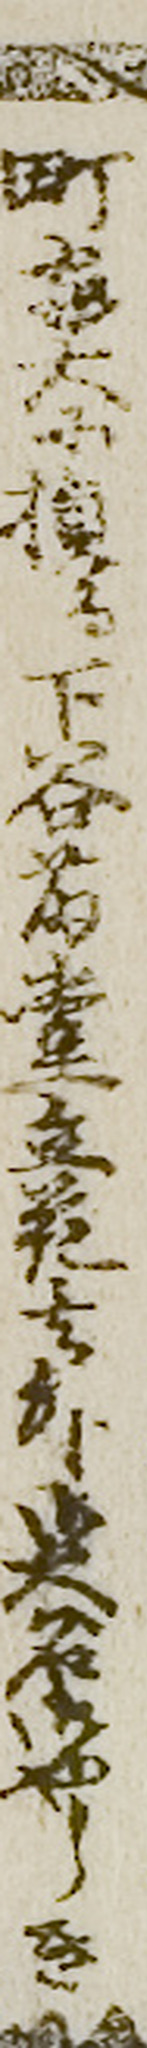町家大に損る下谷藤堂立花其外御大名御やしき
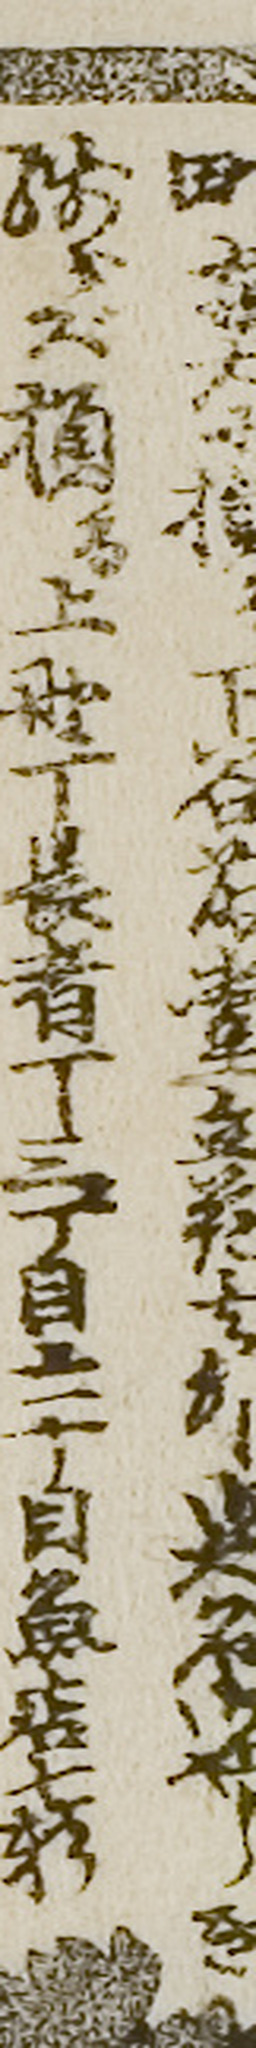残らず損る上野丁長者丁三丁目六丁目魚店七新
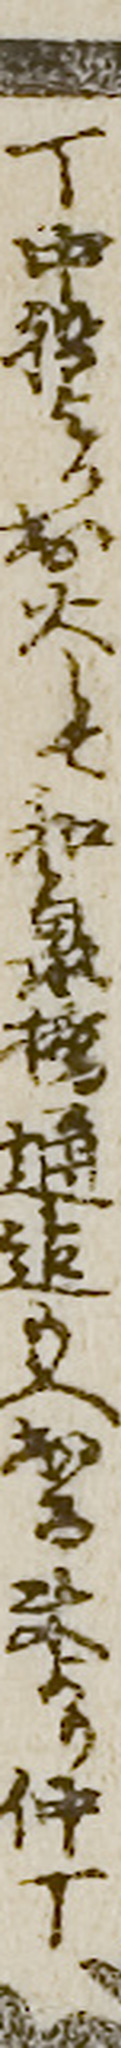丁中程より出火して和泉橋通迄もへ出る夫より仲丁
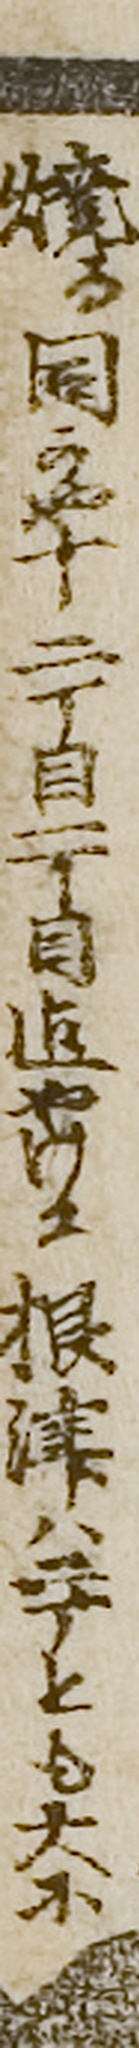焼る同かや丁二丁目一丁目迄やける根津は二丁とも大に
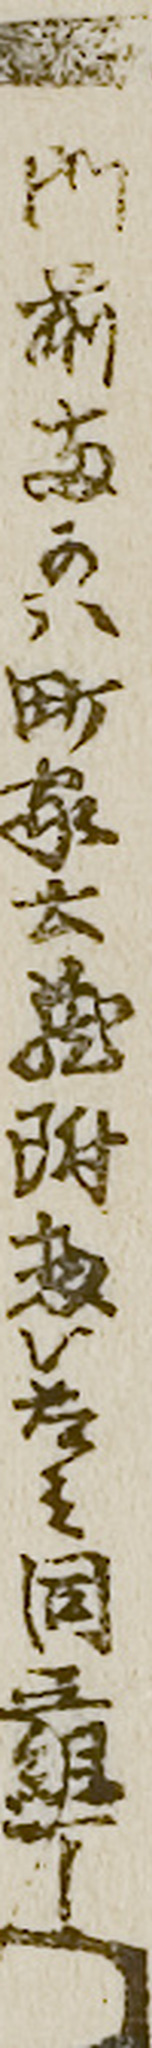門前両かは町家土蔵附惣いたみ同三組丁
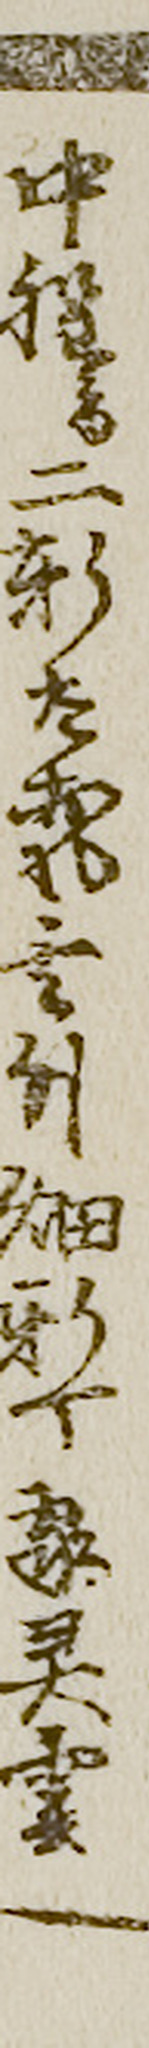中程にて二軒たおれ其外畑新丁竃霊雲
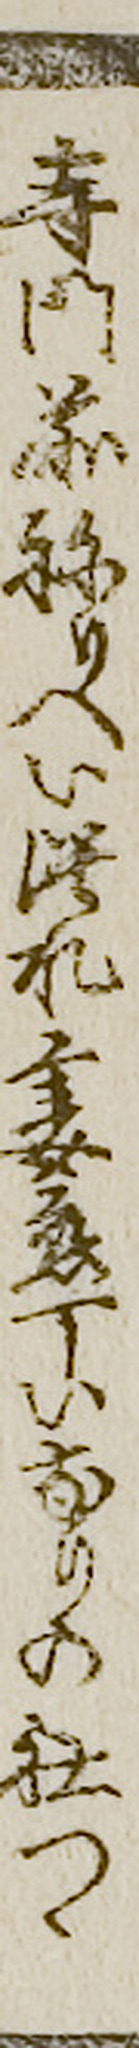寺門前ねりへい潰れ妻恋丁いなりの社つゝ
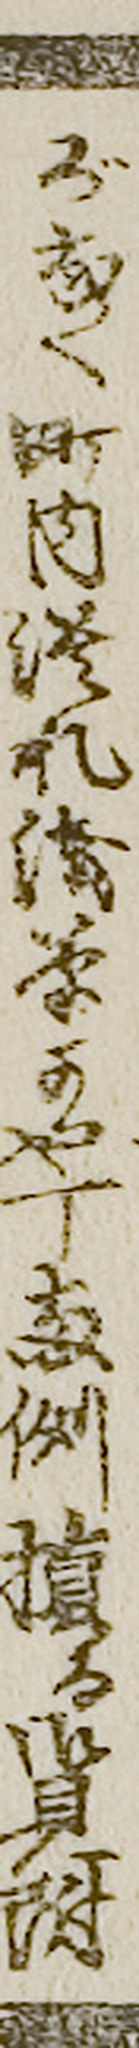がなく町内潰れ浅草かや丁両側損る御見附
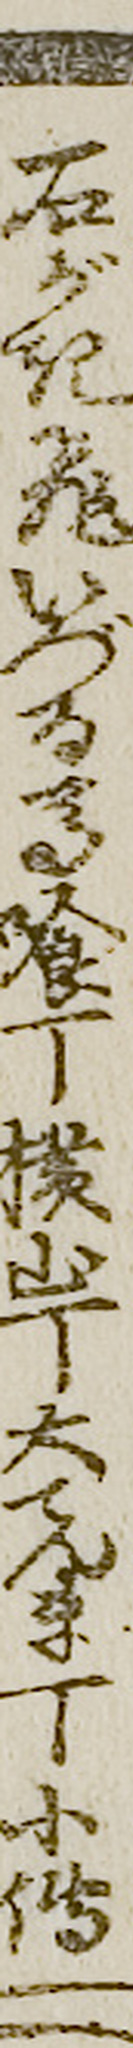石がき飛いづる馬喰丁横山丁大てんま丁小伝
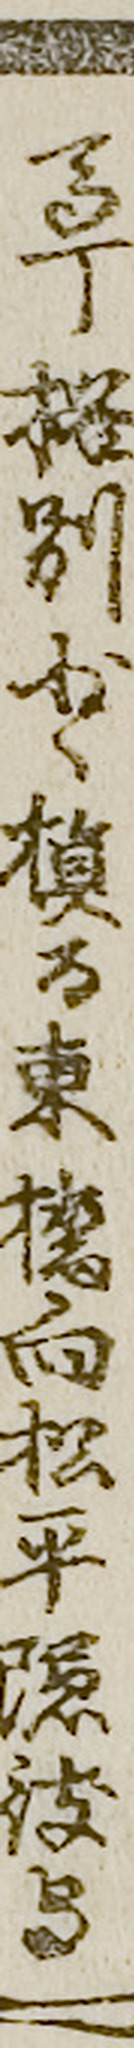馬丁格別少々損る東橋向松平隠岐守
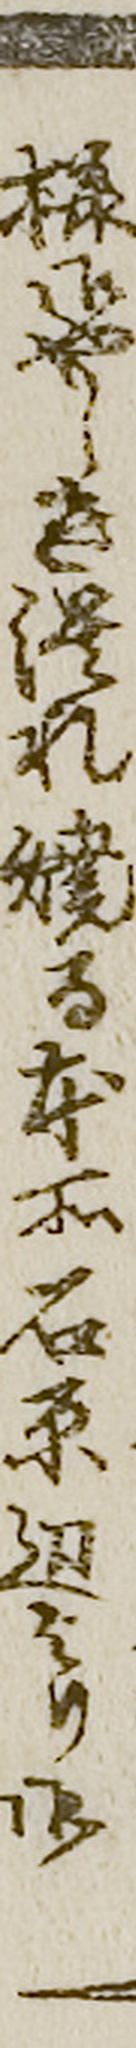様御やしき潰れ焼る本所石原辺より御
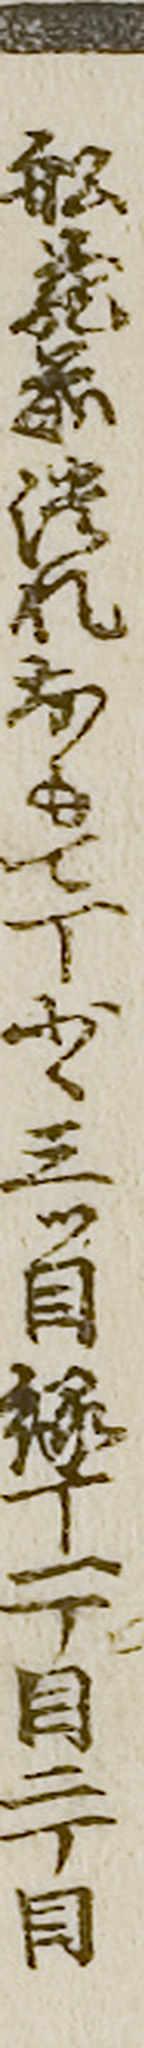船蔵前潰れおもて丁少々三ツ目緑丁一丁目二丁目
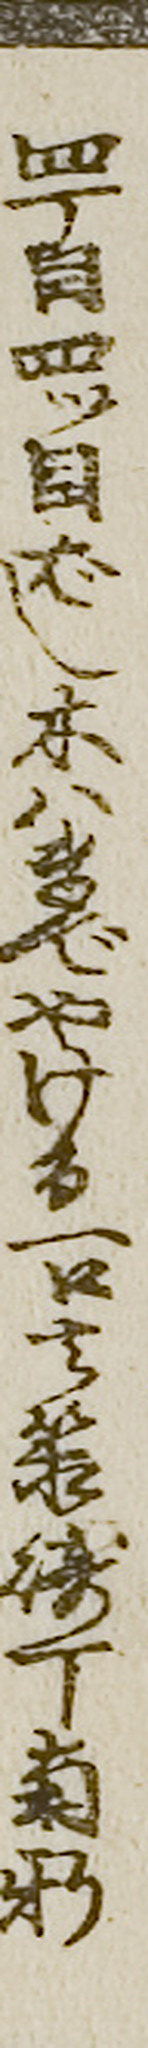四丁目四ツ目ばし木はまでやける一口は箱崎丁南新
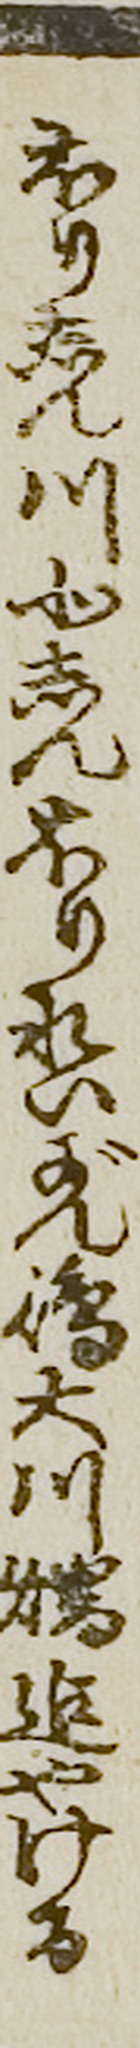ほりしん川北しんほりれいがん嶋大川橋迄やける
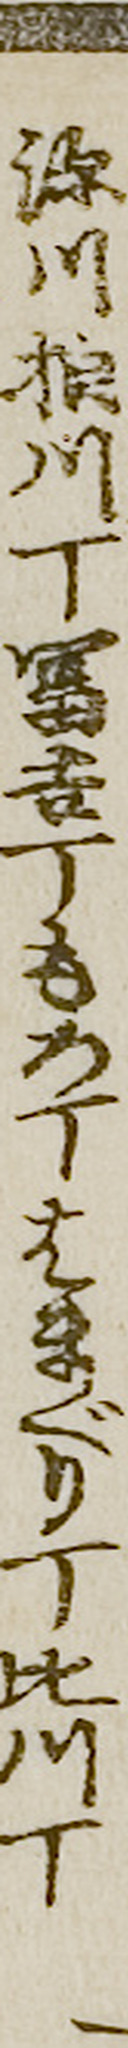深川相川丁冨吉丁もろ丁はまぐり丁北川丁
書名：江戸大地震出火場所附
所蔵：東京大学総合図書館 General Library in the University of Tokyo, JAPAN
